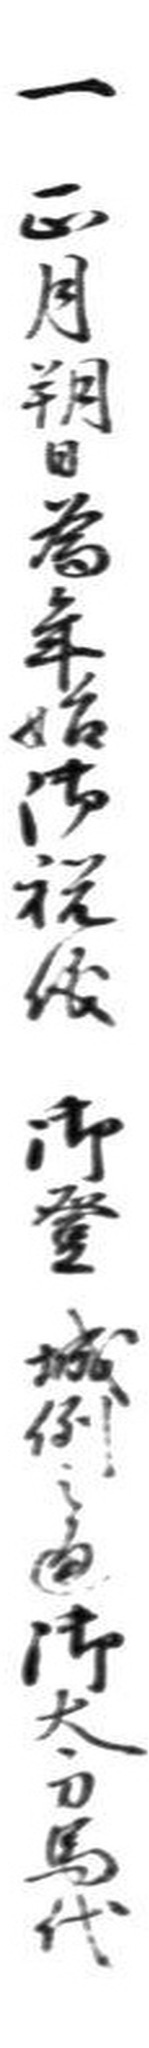一正月朔日為年始御祝儀御登城例之通御太刀馬代
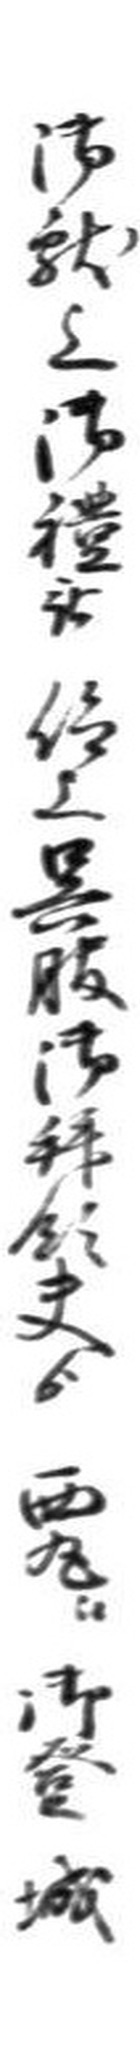御献上御礼被仰上呉服御拝領夫ゟ西丸江御登城
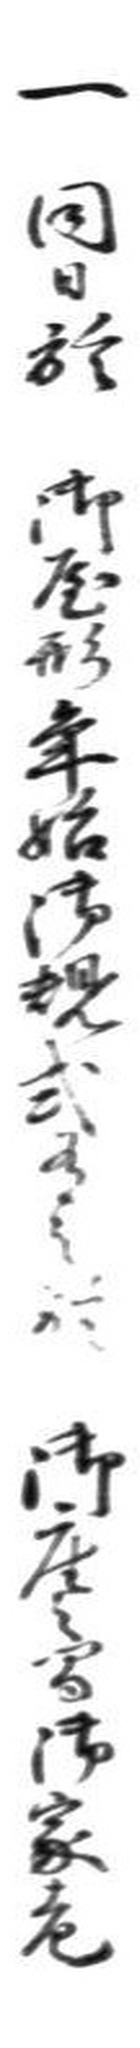一同日於御屋形年始御規式有之於御座之間御家老
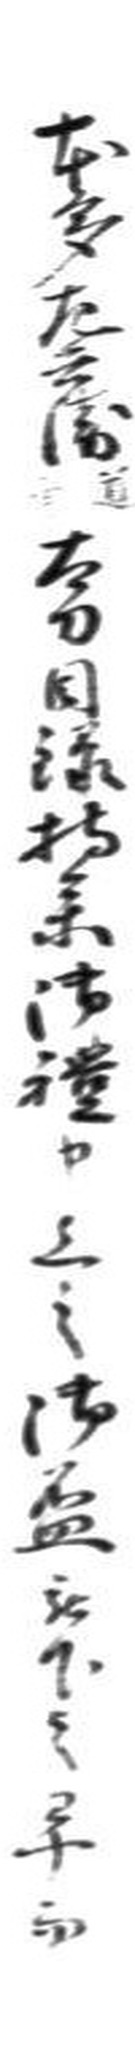本多左兵衛道重太刀目録持参御礼申上之御盃被下之畢而
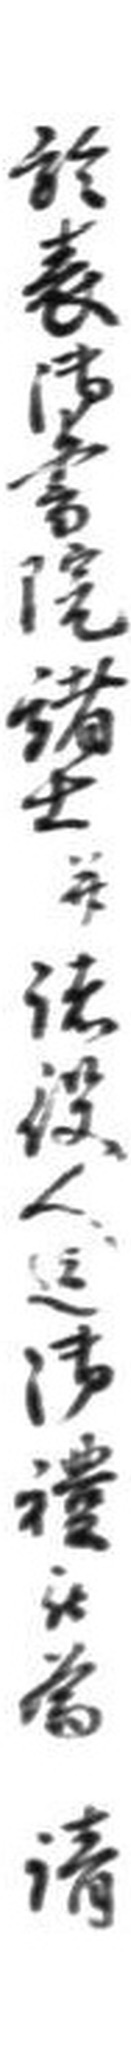於表御書院諸士并諸役人迄御礼被為請
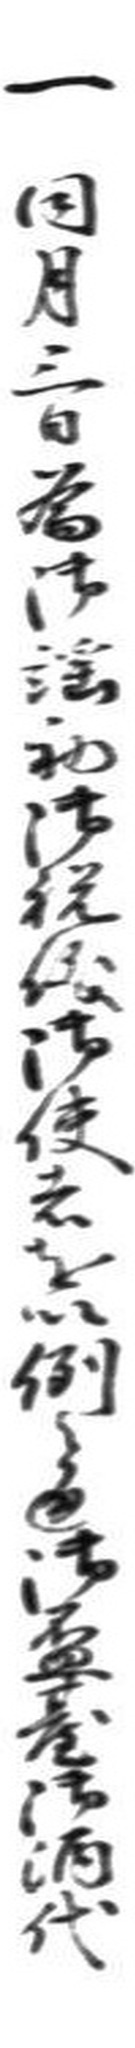一同月三日為御謡初御祝儀御使者を以例之通御盃台御酒代

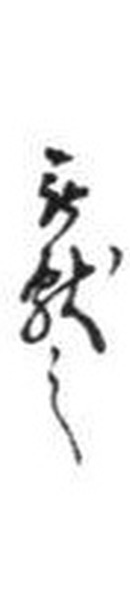被献之
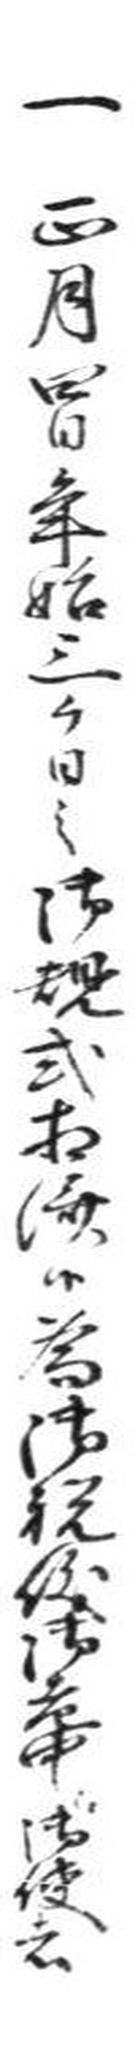一正月四日年始三ヶ日之御規式相済候為御祝儀御老中江御使者
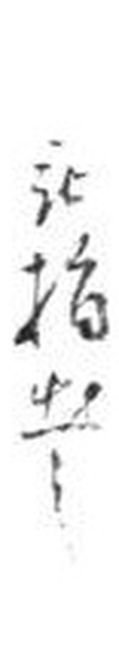被指出之
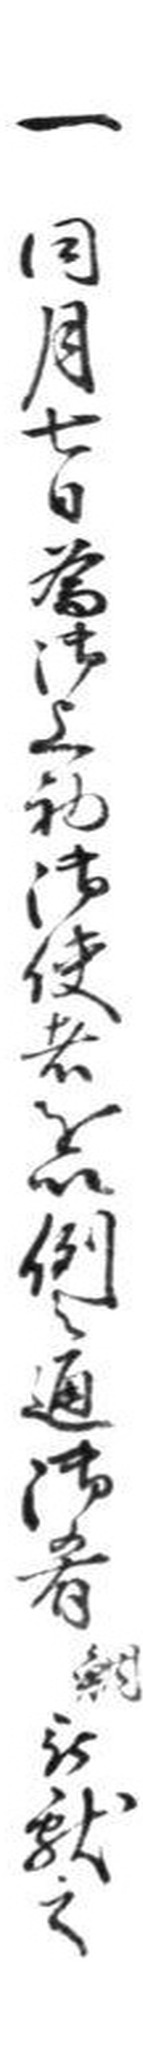一同月七日為御上初御使者を以例之通御肴鯛被献之
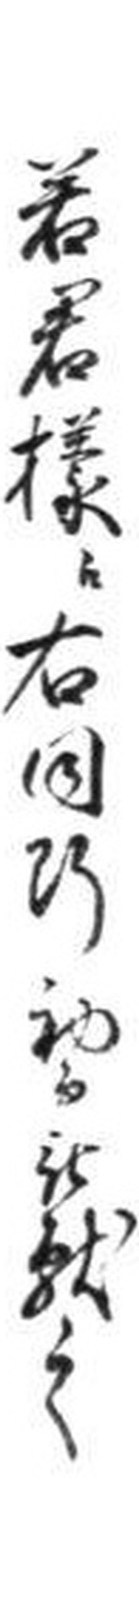若君様江右同断初而被献之
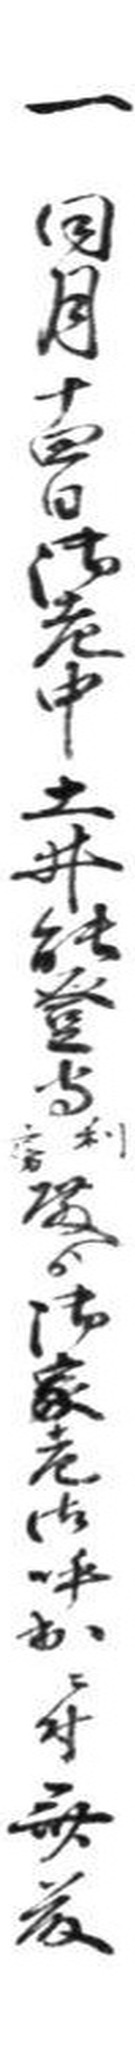一同月十四日御老中土井能登守利房殿ゟ御家老御呼出ニ付斎藤
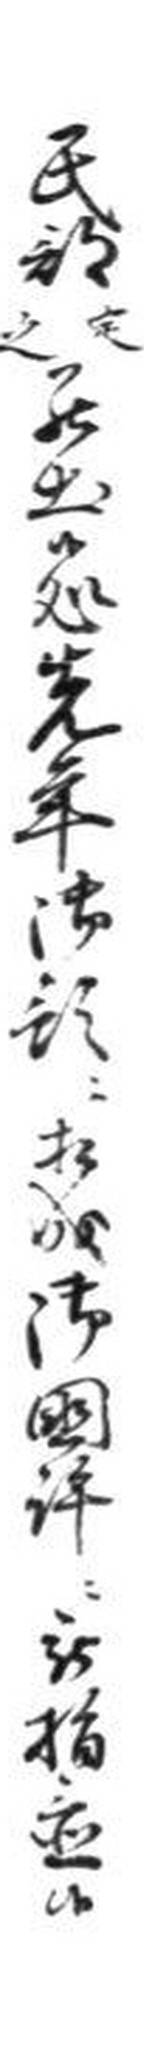民部定之罷出候処先年御預ニ相成御国許ニ被指置候
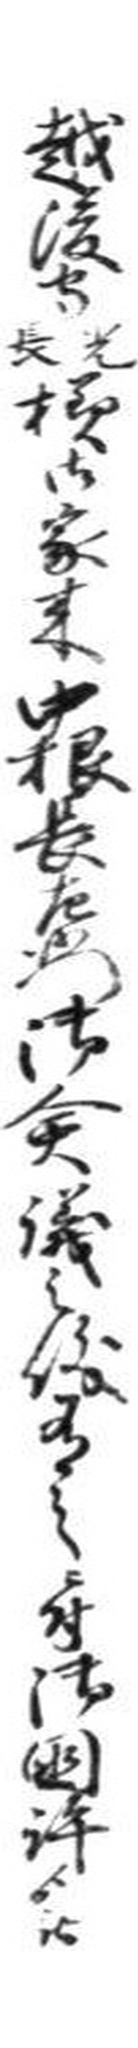越後守光長様御家来中根長左衛門御僉議之儀有之ニ付御国許ゟ被
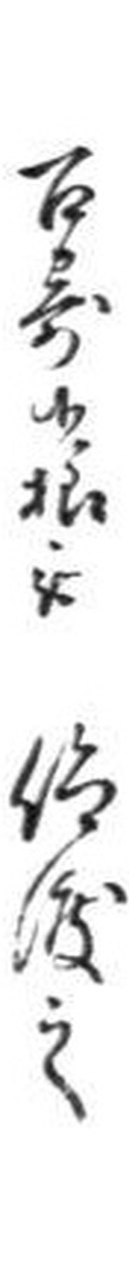召寄候様被仰渡之
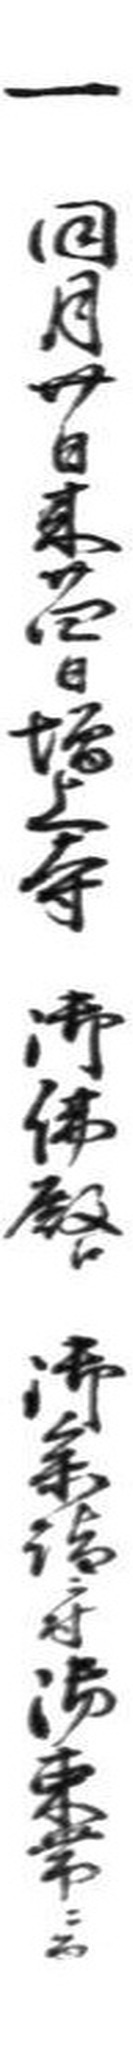一同月廿日来廿四日増上寺御仏殿江御参詣ニ付御束帯ニ而
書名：家譜 十五 綱昌公 従天和元年到元禄十二年
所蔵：福井県文書館 Fukui Prefectural Archives
